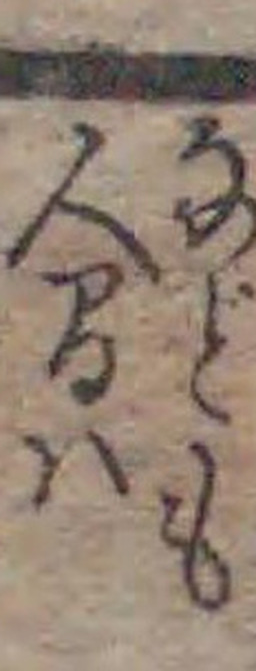人間は
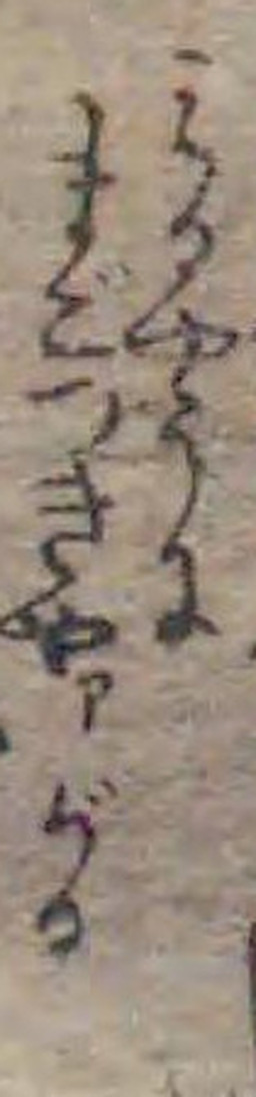まごつきやァがる
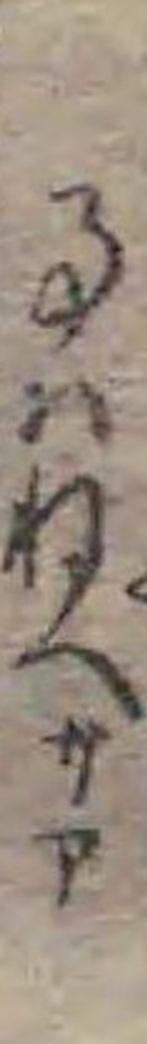事はねへサァ
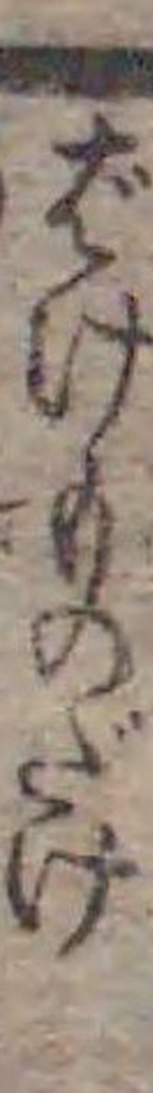ばけものだけ
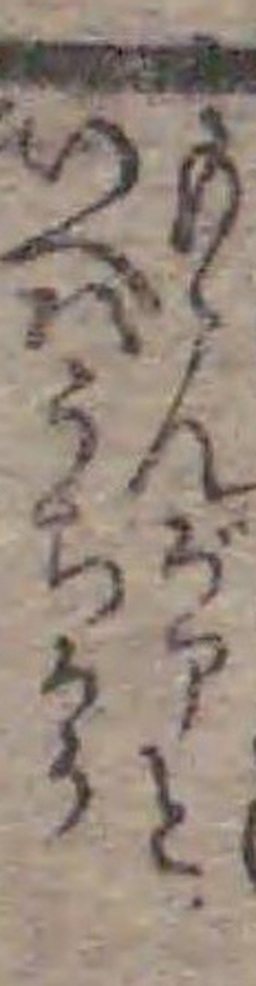いへはうちから

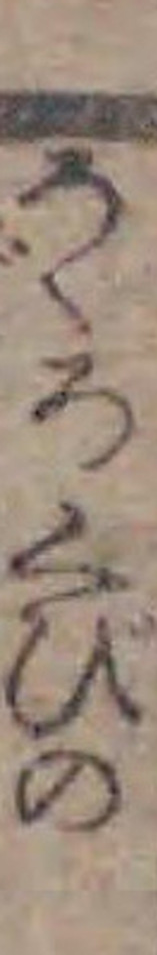ろくろくびの
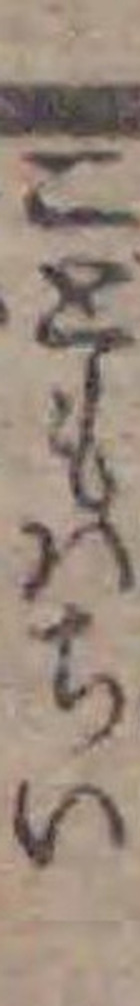こどもはちい
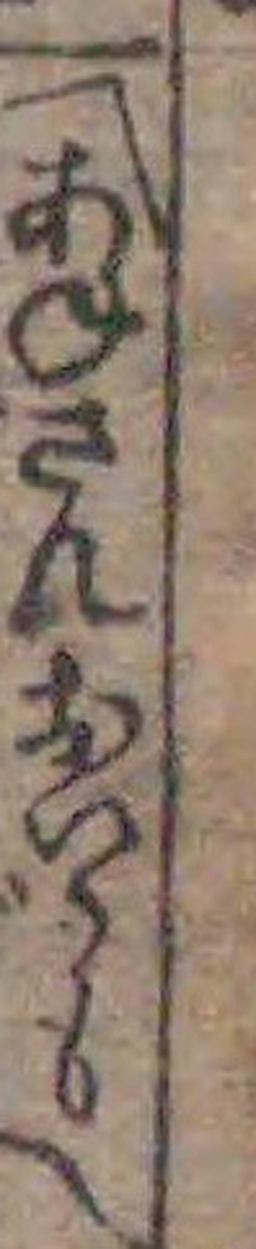〽あねさんおいらも
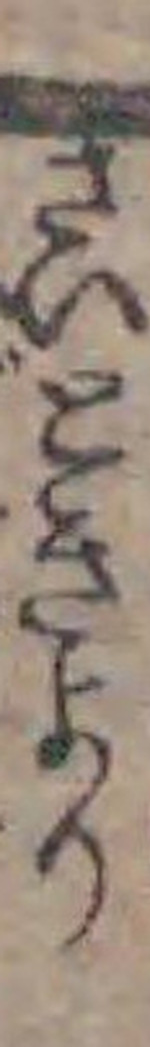さいときより
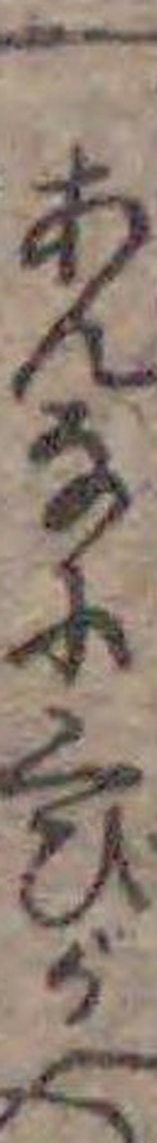あんなにくびが
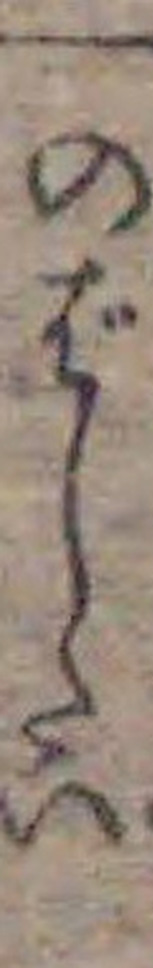のばしたい
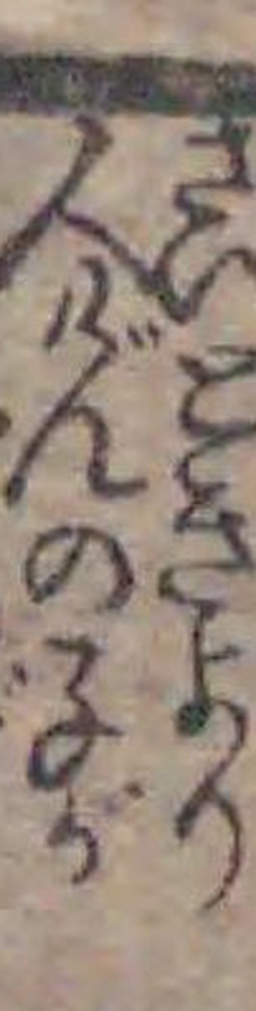人げんの子が
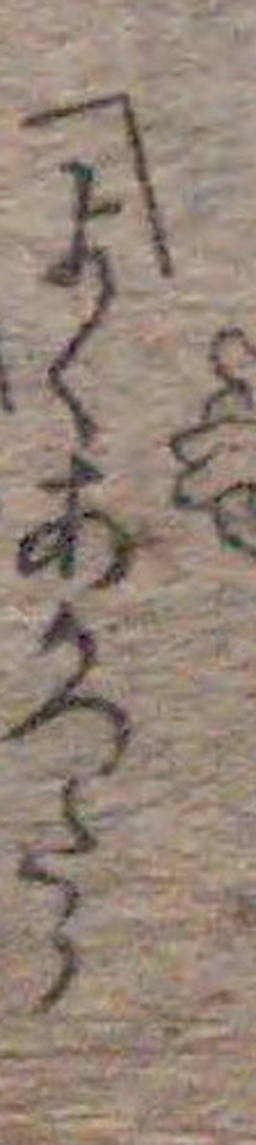〽よくあかつたら
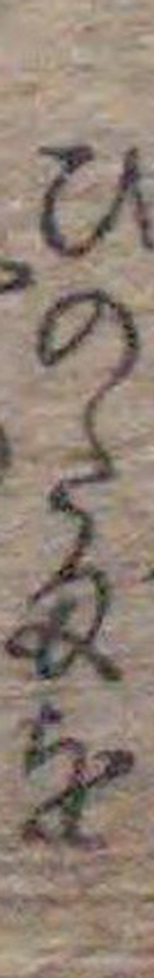ひのたまを
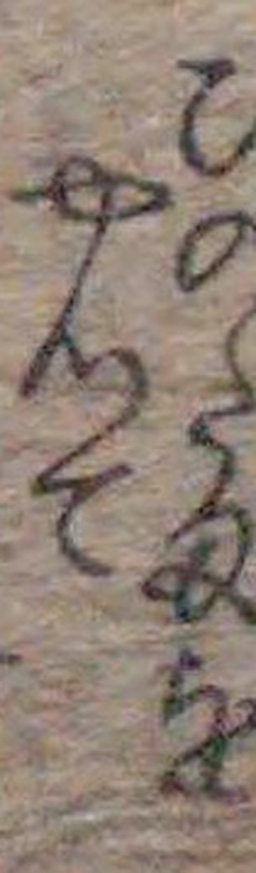やつて
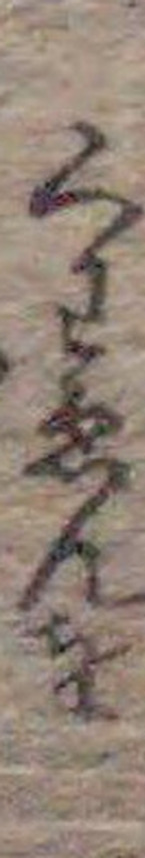くわゑんを
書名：年中行状記 : 2巻
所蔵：国立国会図書館 National Diet Library, JAPAN
